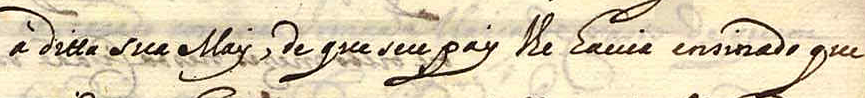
à ditta sua May, de que seu pay lhe hauia ensinado que
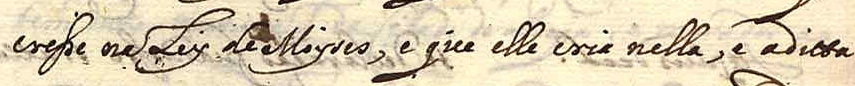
cresse na Ley de Moyses, e que elle cria nella, e a ditta
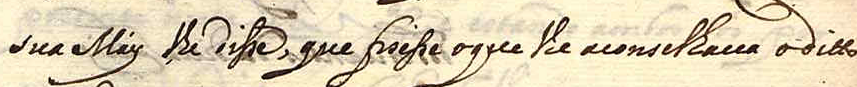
sua May lhe disse, que fisesse o que lhe aconselhaua o ditto
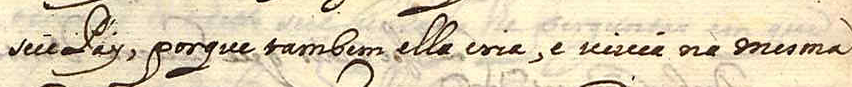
seu Pay, porque tambem ella cria, e uiuia na mesma
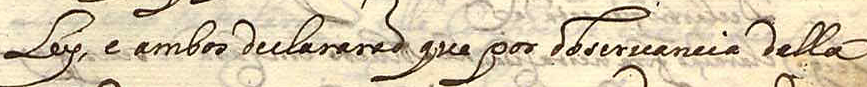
Ley, e ambos declararaõ que por obseruancia della
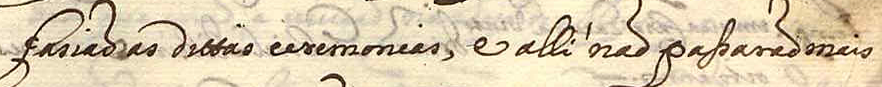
fasiaõ as dittas ceremonias, e alli naõ passaraõ mais
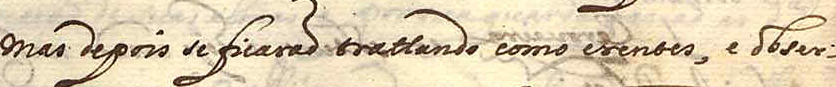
mas depois se ficaraõ trattando como crentes, e obser
